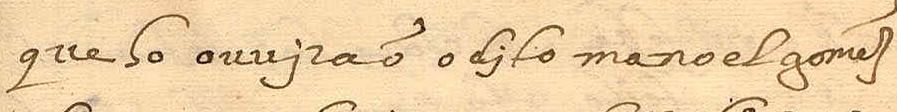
que ho ouujraõ o djto manoel gomēz
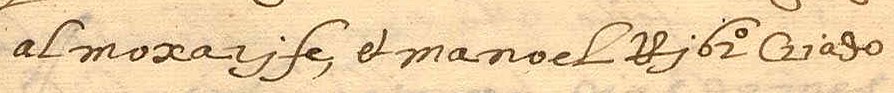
almoxarjfe, & manoel Ribro criado
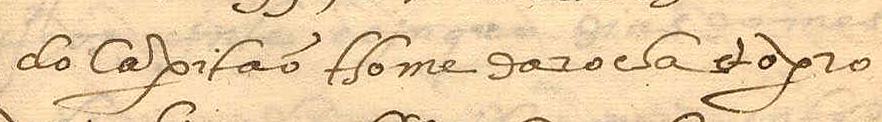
do capitaõ thome da rocha & pro
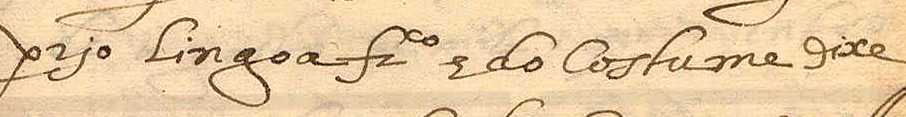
prjo Lingoa frco E do Costume dixe
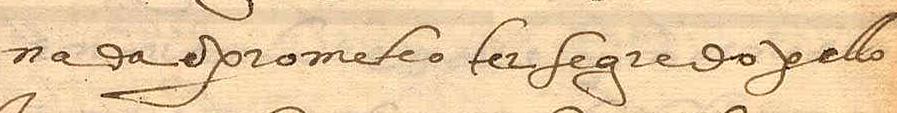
nada e prometeo ter segredo pello
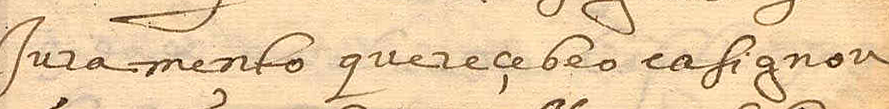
Juramento que recebeo e asignou
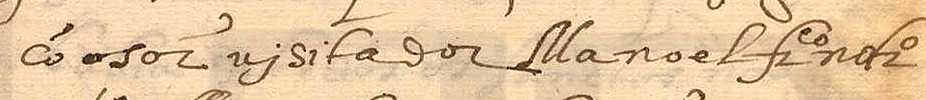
cō o sor̄ ujsitador Manoel frco notro
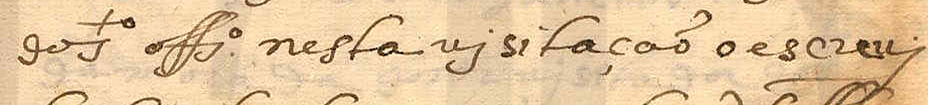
do sto offjo. nesta ujsitaçaõ o escreuj
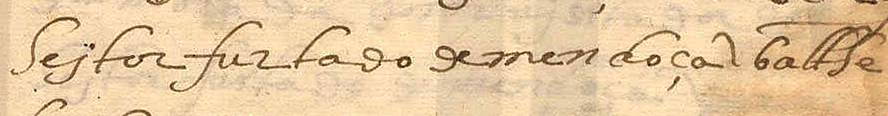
hejtor furtado de mendoça balthe
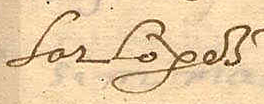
sar Lopez
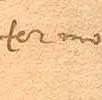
termo
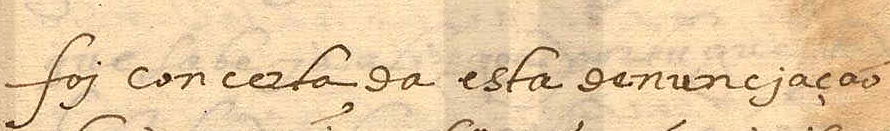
foj concertada esta denuncjaçaõ
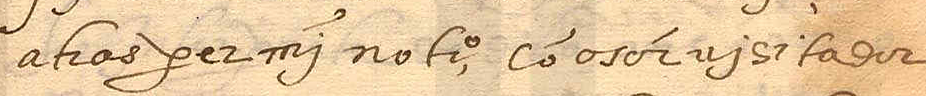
atras per mj̄ notro cō o sor̄ ujsitador
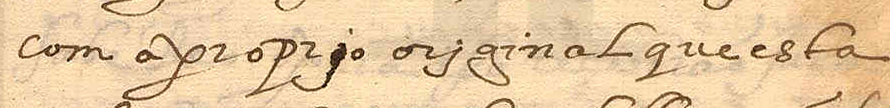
com o proprjo orjginal que esta
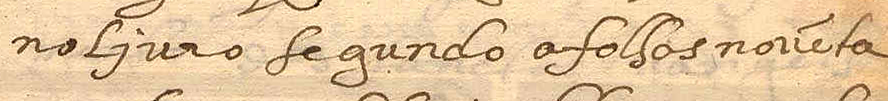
no ljuro segundo a folhas nouēta
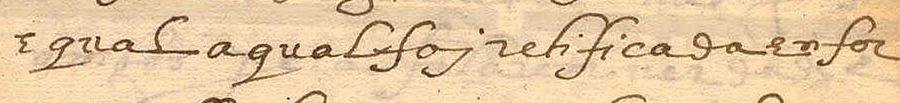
E qual a qual foj retificada en for
